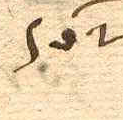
Sor̄
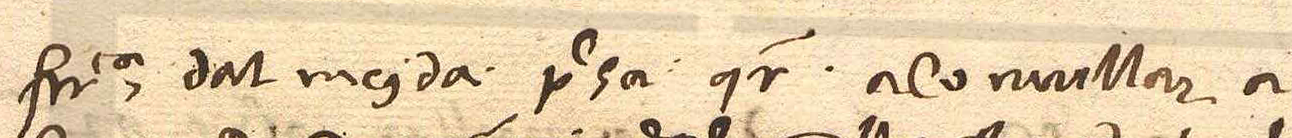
frrca dalmejda p̄sa qr̄ acomullar a
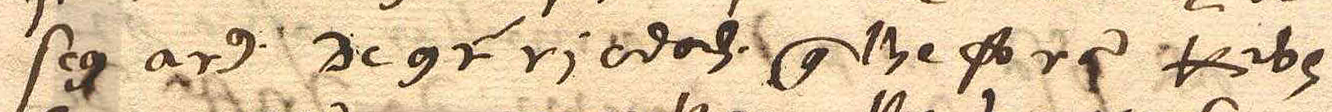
seꝯ arꝯ de ꝯt̄rjedad. q̄ lhe forā Rdos
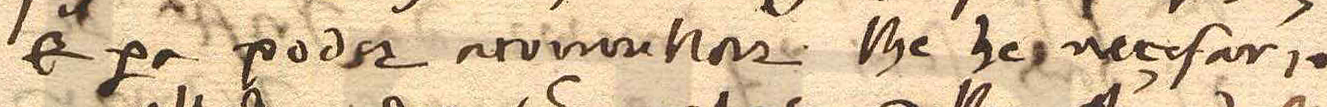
E ꝑa poder acomullar lhe he necesario
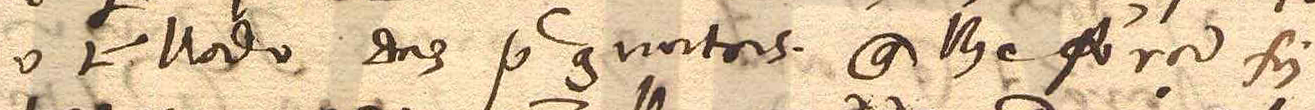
o t̄llado das p̄guntas q̄ lhe forā fej
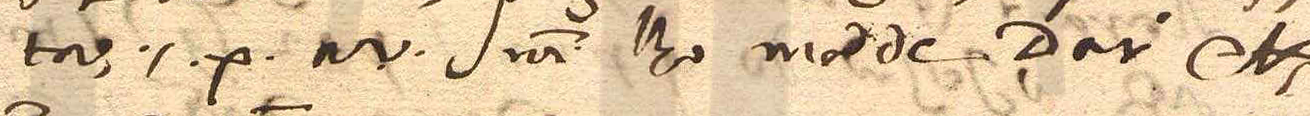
tas./ .p. a v. m̄ lho māde dar e Rꝭ
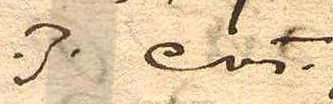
J. e m̄.
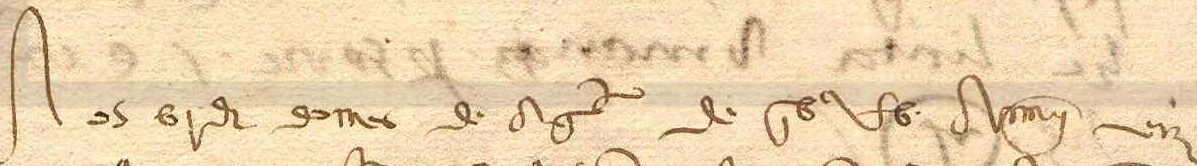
Aos bj di do mes de Agto de j̄bcRb Annꝯ em
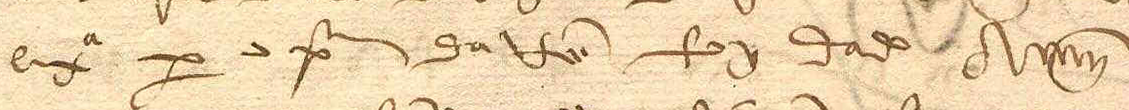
lixa ꝑ o por da Ree foy dado A mȳ
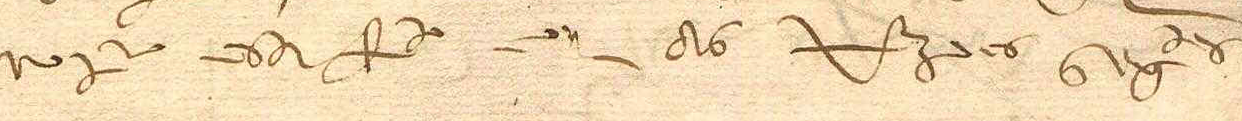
notro este fto com As Rezoes segtes
